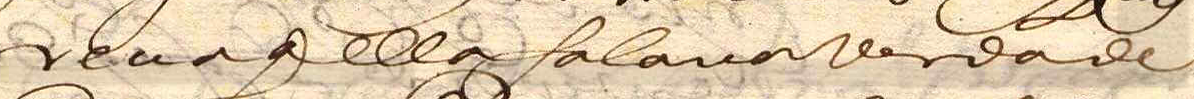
recia q̄ ella falaua verdade
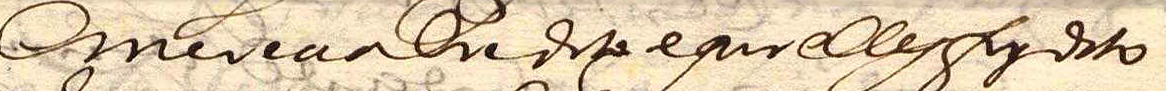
E merecia Credito e por elles foy dito
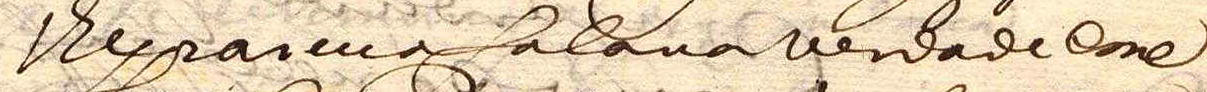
lhes parecia falaua verdade e me
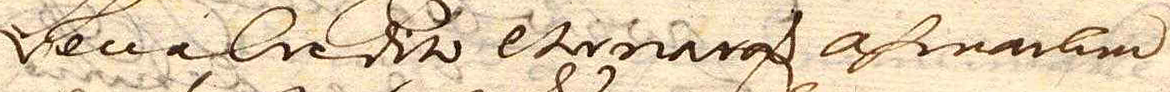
recia Credito e tornaraõ asinarem
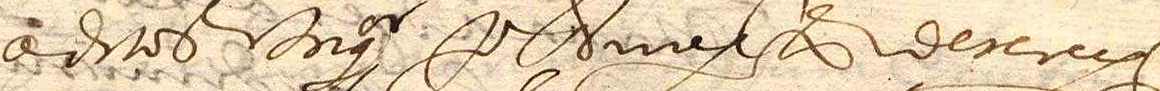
o dito sr Inqor Joaõ Nunes & o escreuj
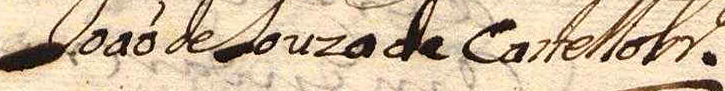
Ioaõ de Souza de Castellobr.co
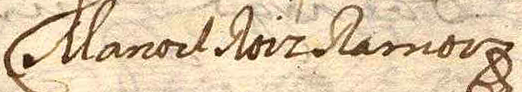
Manoel Roiz̄ Ramos
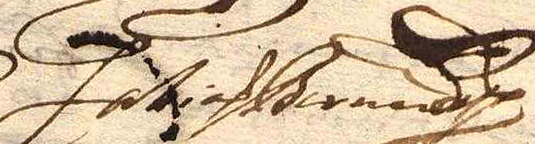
Fabião Bernardes
